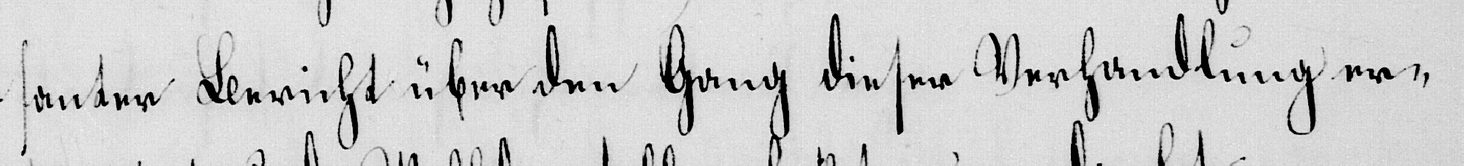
anter Bericht über den Gang dieser Verhandlung er¬
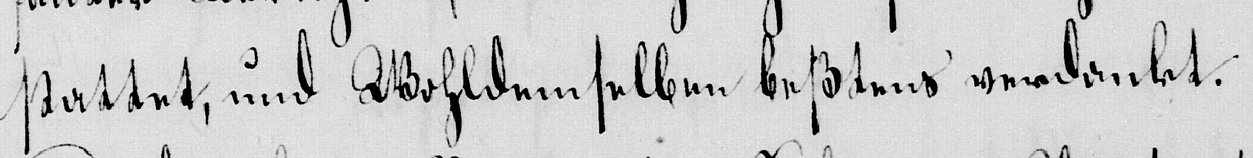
stattet, und Wohldemselben beßtens verdankt.
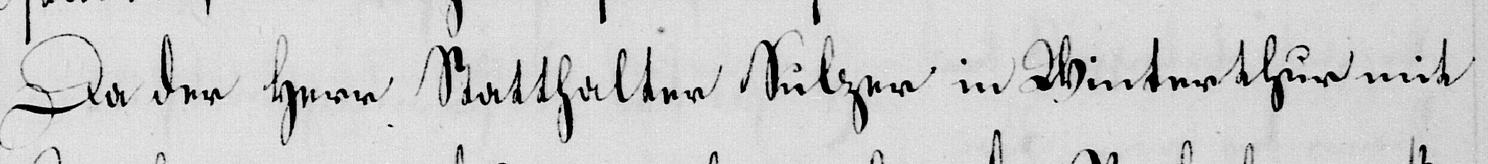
Da der Herr Statthalter Sulzer in Winterthur mit
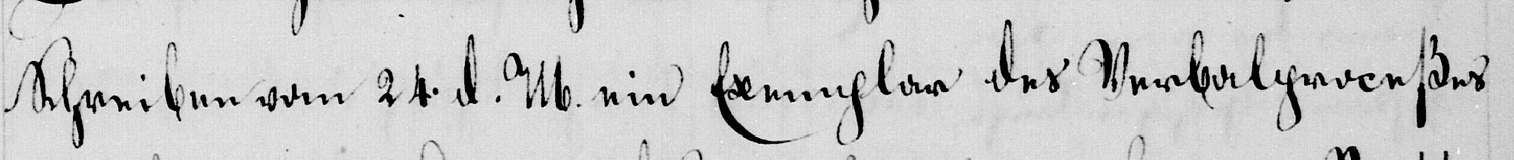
Schreiben vom 24. d. M. ein Exemplar des Verbalproceßes
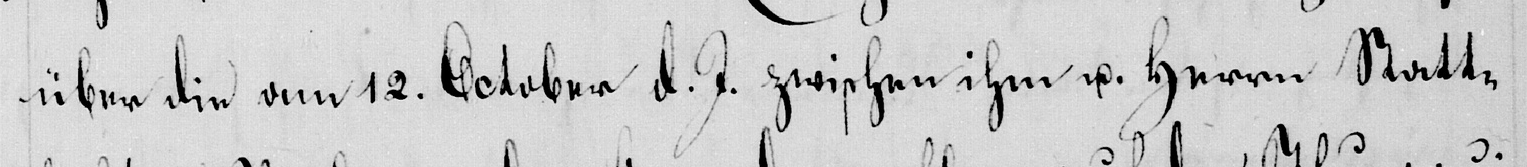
über die am 12. October d. J. zwischen ihm u. Herrn Statt¬
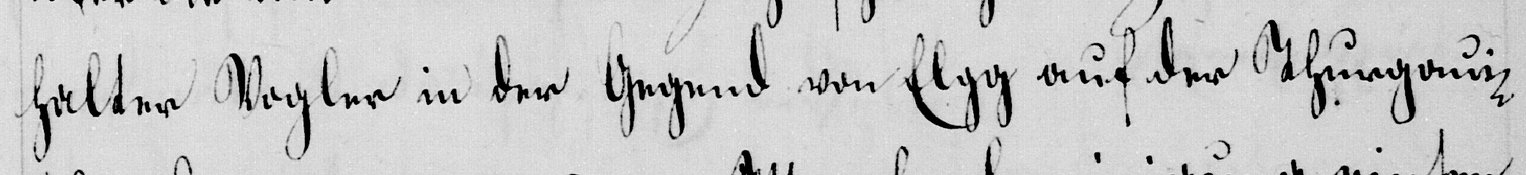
halter Vogler in der Gegend von Elgg auf der Thurgaui¬
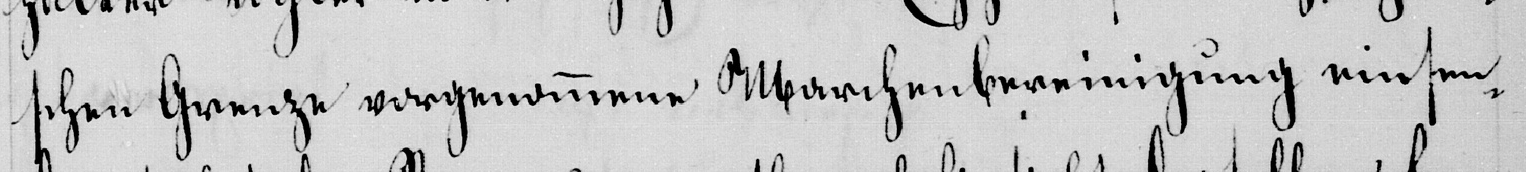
schen Grenze vorgenommenen Marchenbereinigung einsen¬
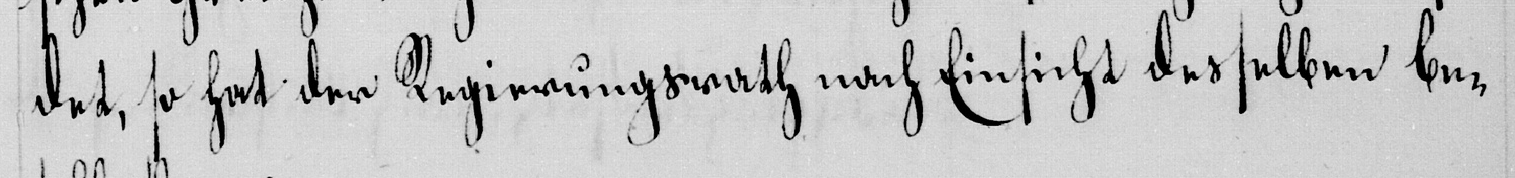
det, so hat der Regierungsrath nach Einsicht desselben be¬
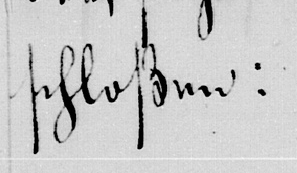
schloßen:
